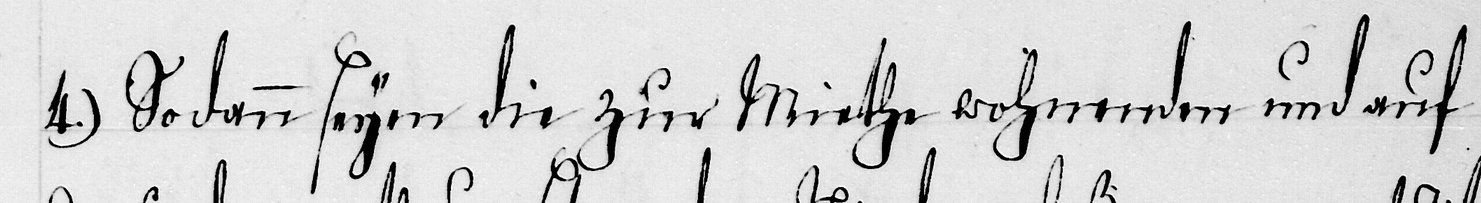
4.) Sodann seyen die zur Miethe wohnenden und auf
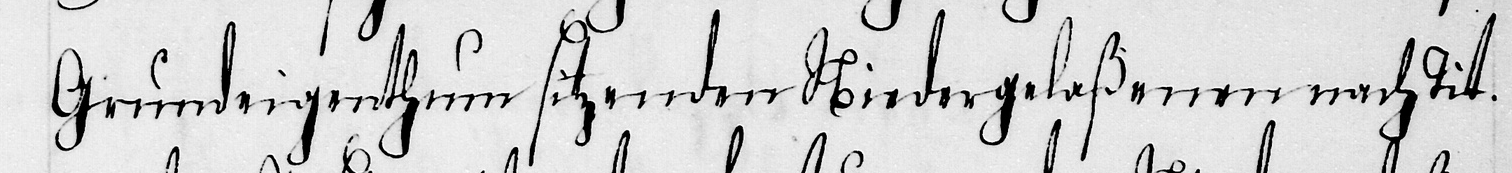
Grundeigenthum sitzenden Niedergelaßenen nach Tit.
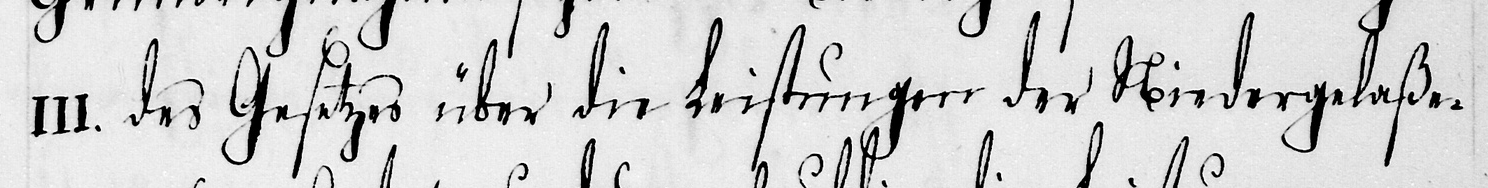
II. des Gesetzes über die Leistungen der Niedergelaße¬
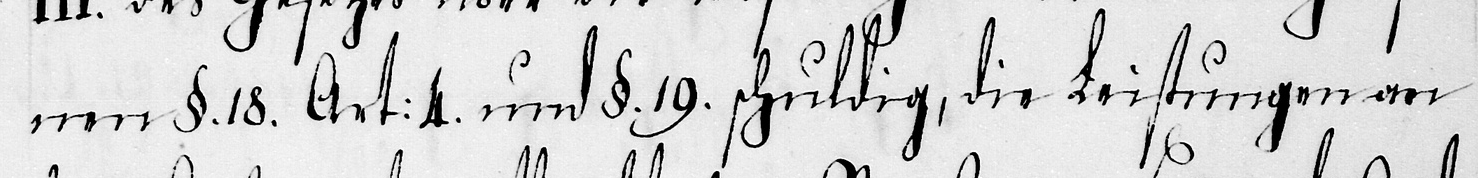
nen §. 18. Art: 4. und §. 19. schuldig, die Leistungen an
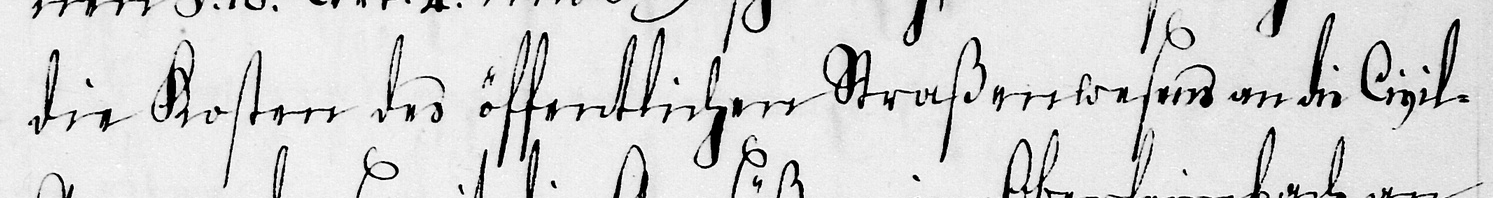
die Kosten des öffentlichen Straßenwesens an die Civi¬
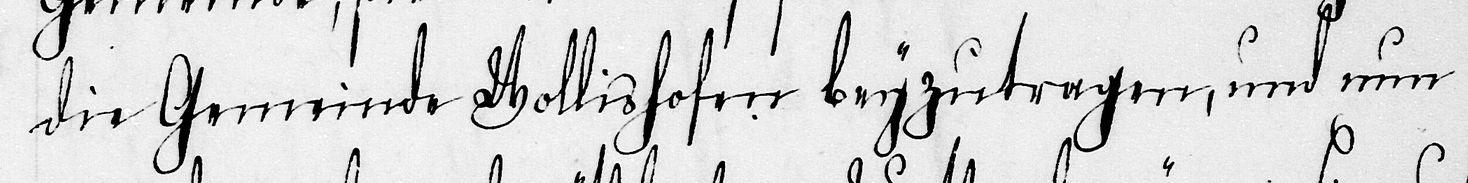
die Gemeinde Wollishofen beyzutragen, und nun
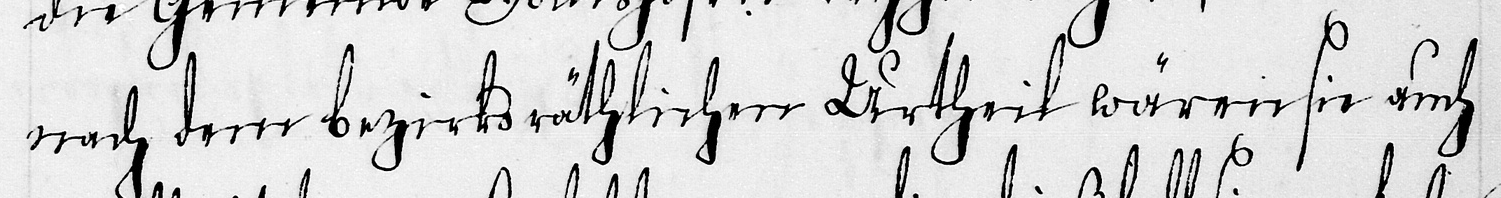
nach dem bezirksräthlichen Urtheil wären sie auch
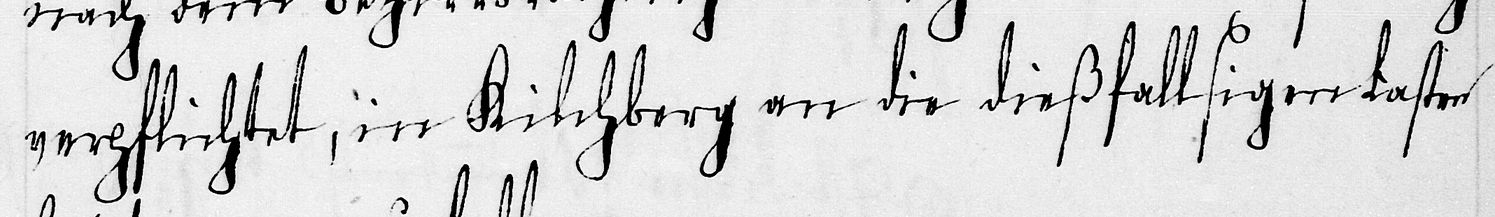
verpflichtet, in Kilchberg an die diesfallsigen Lasten
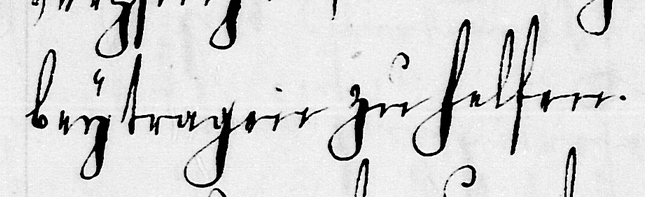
beytragen zu helfen.
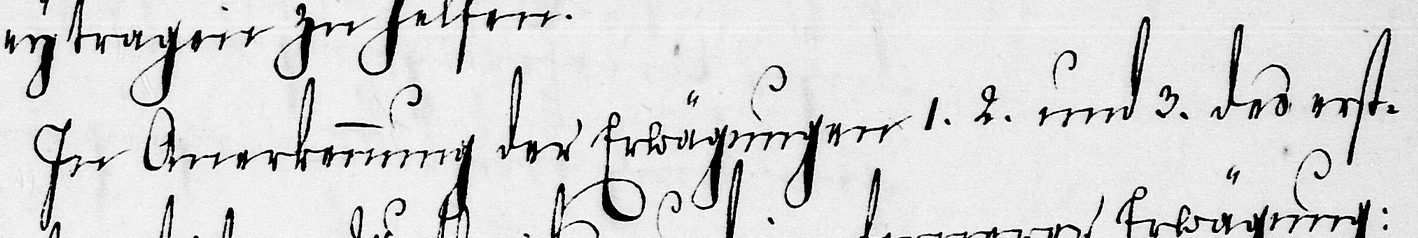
In Anerkennung der Erwägungen 1. 2. und 3. des erst¬
